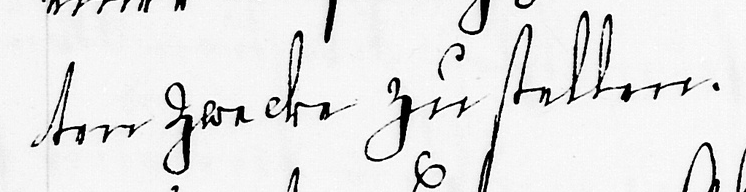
ten Zwecke zu stellen.
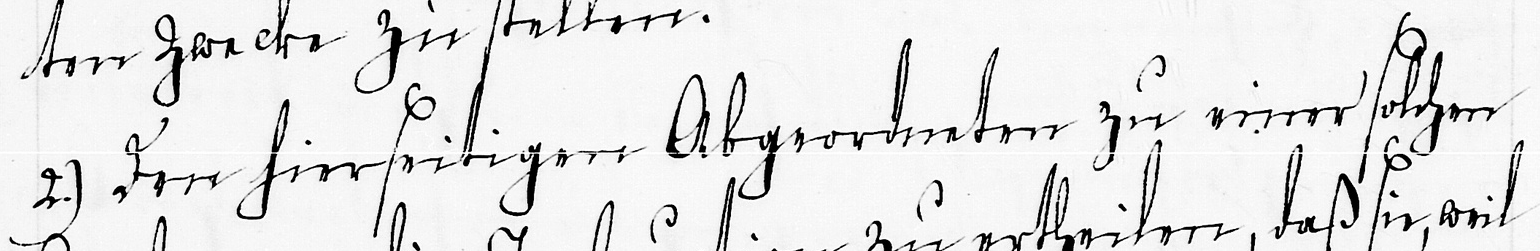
2.) Den hierseitigen Abgeordneten zu einer solchen
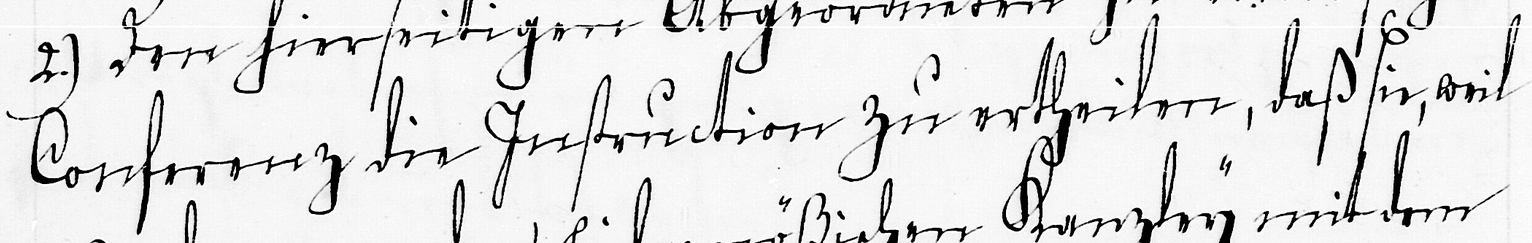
Conferenz die Instruction zu ertheilen, daß sie,
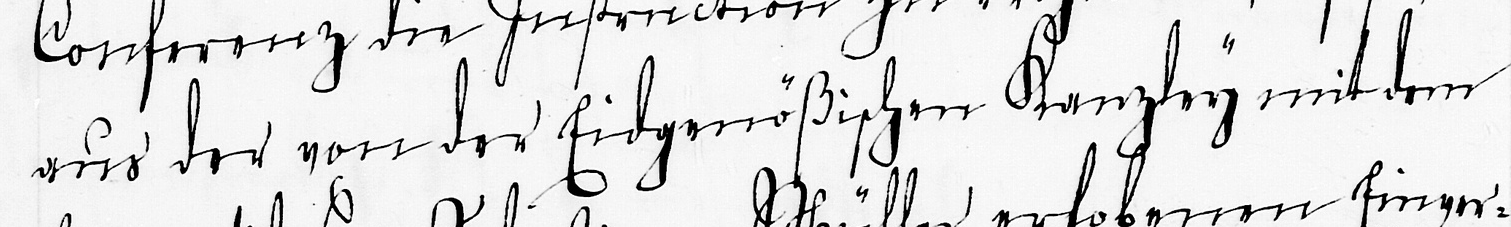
aus der von der Eidgenößischen Kanzley mit dem
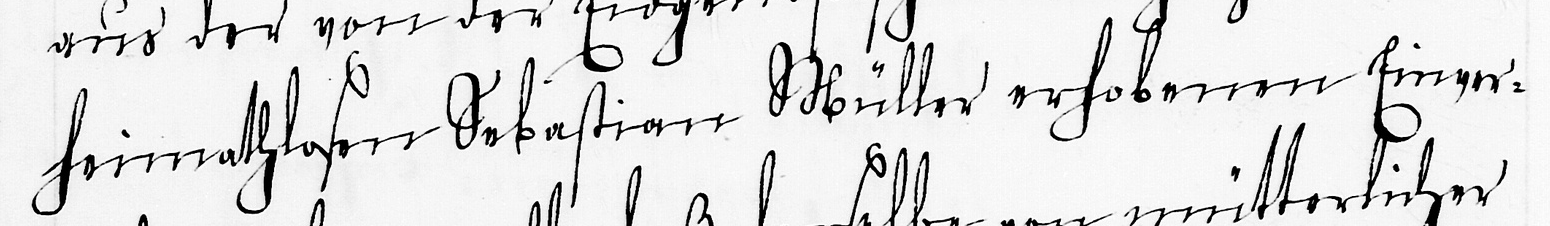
heimathlosen Sebastian Müller erhobenen Einver¬
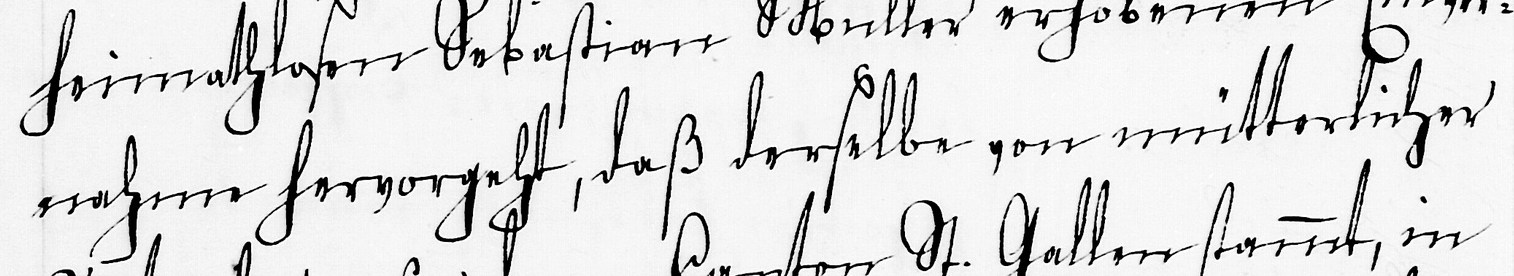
nahme hervorgeht, daß derselbe von mütterlicher
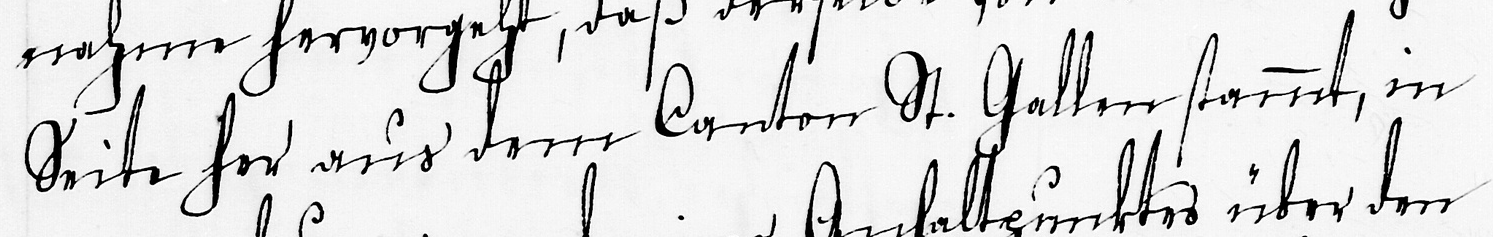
Seite her aus dem Canton St. Gallen stammt, in
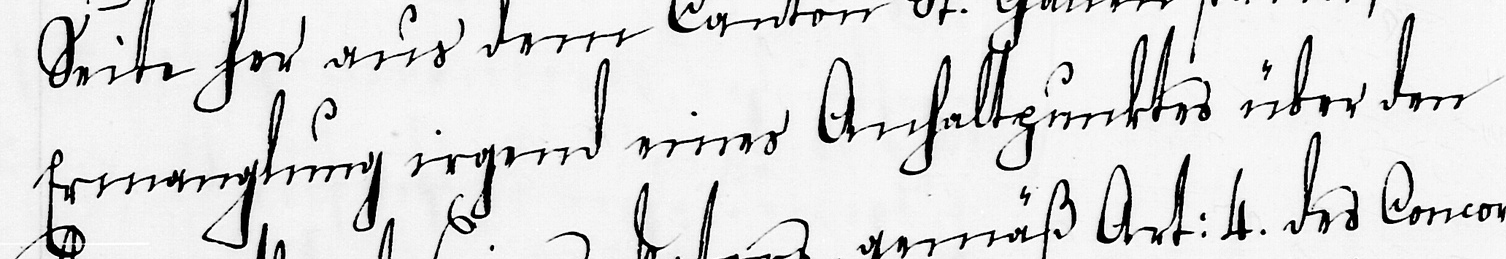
Ermanglung irgend eines Anhaltpunktes über den
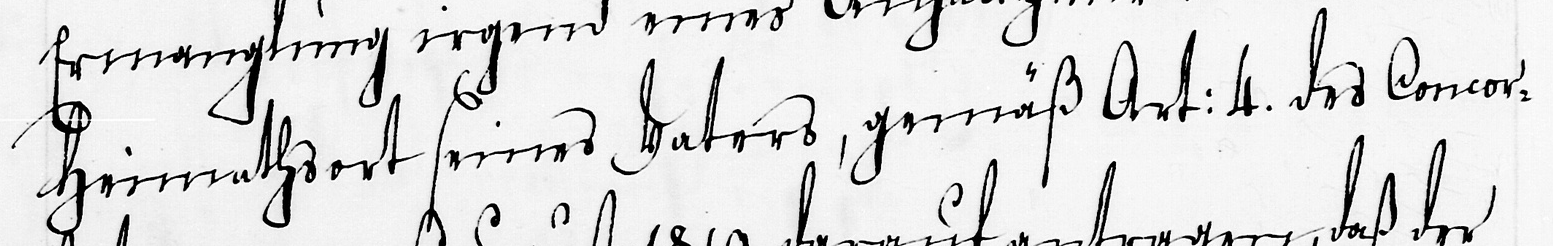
Heimathsort seines Vaters, gemäß Art: 4. des Concor¬
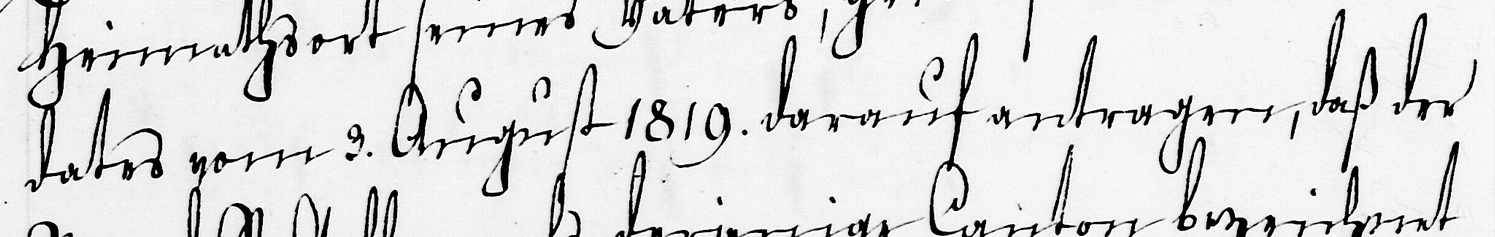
dates vom 3. August 1819. darauf antragen, daß der
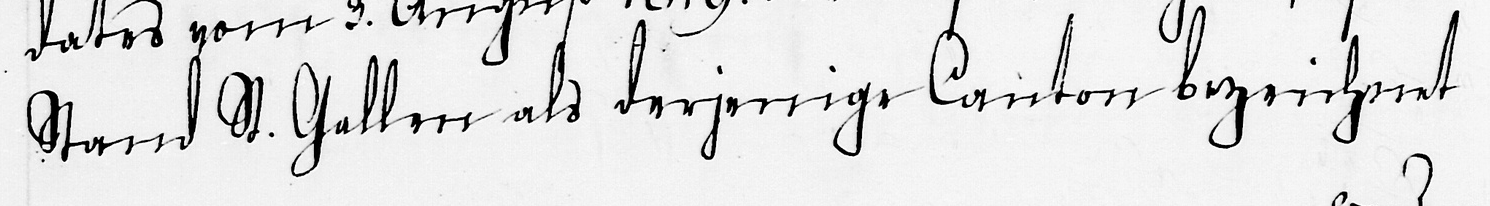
Stand St. Gallen als derjenige Canton bezeichnet
